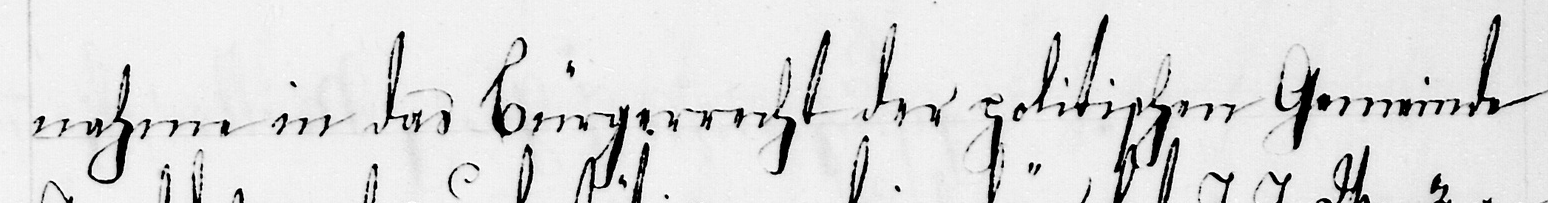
nahme in das Bürgerrecht der politischen Gemeinde
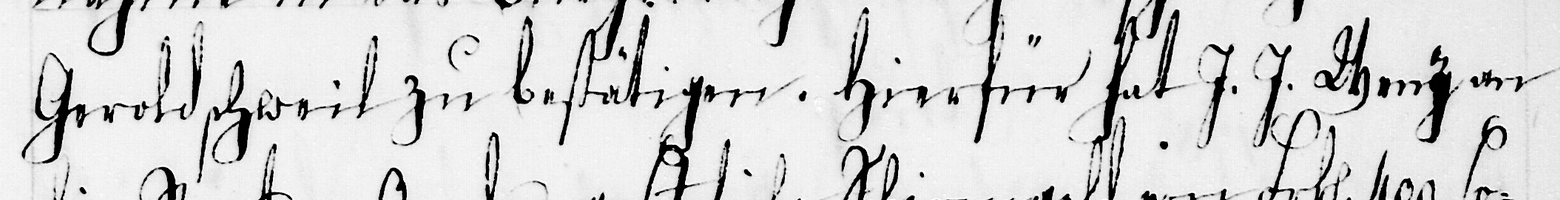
Geroldschweil zu bestätigen. Hierfür hat J. J. Wenz an
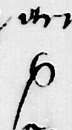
e.
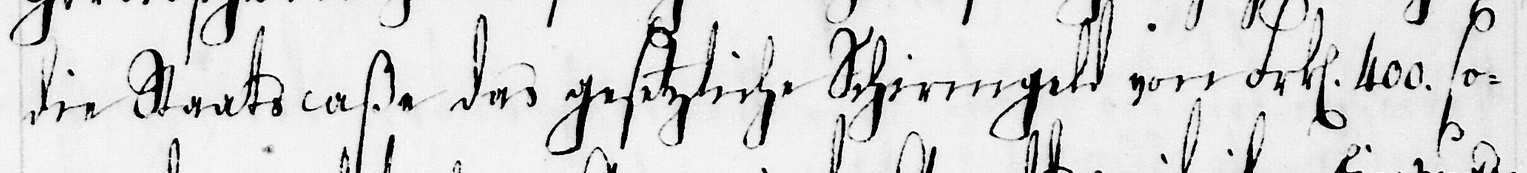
die Staatscaße das gesetzliche Schirmgeld von Frk[en]. 400. so¬
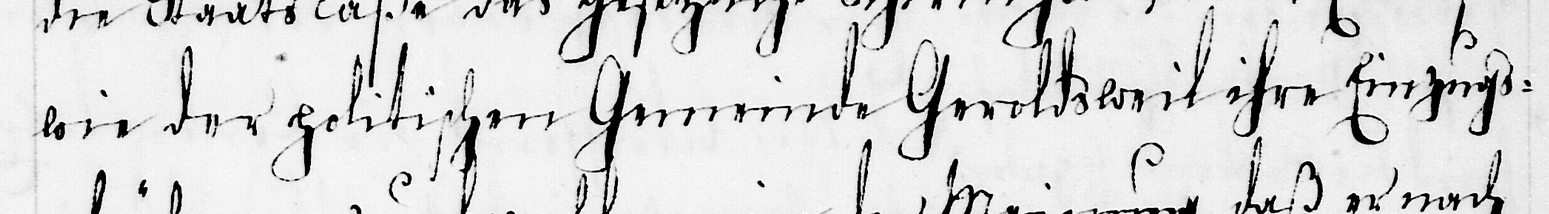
wie der politischen Gemeinde Geroldsweil ihre Einzugs¬
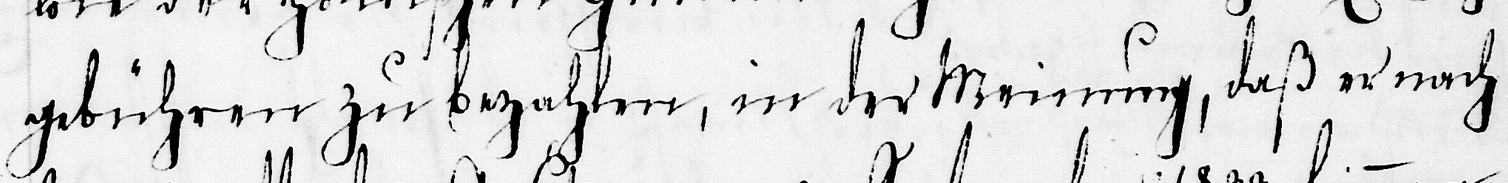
gebühren zu bezahlen, in der Meinung, daß er nach
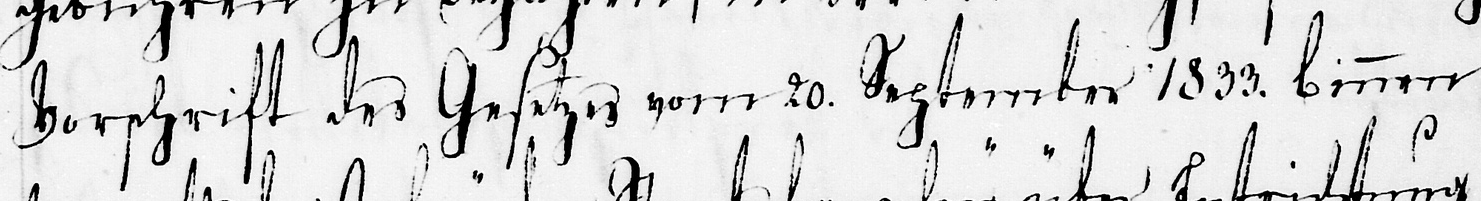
Vorschrift des Gesetzes vom 20. September 1833. binnen
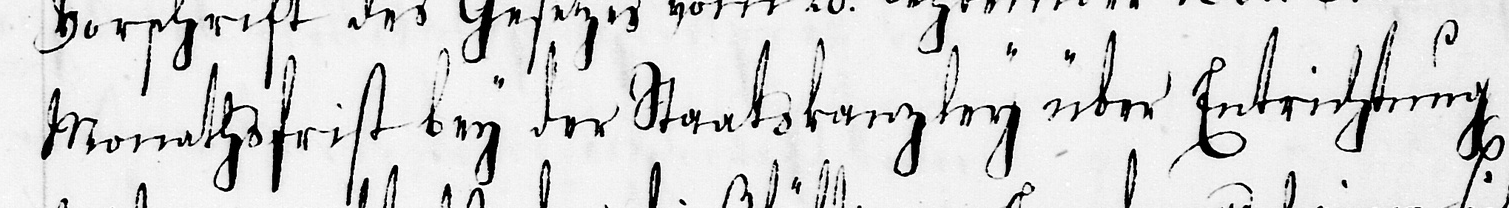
Monathsfrist bey der Staatskanzley über Entrichtung
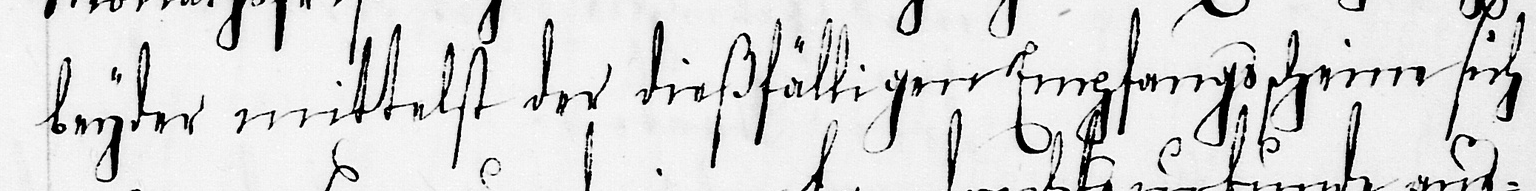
beyder mittelst der dießfälligen Empfangsscheine sich
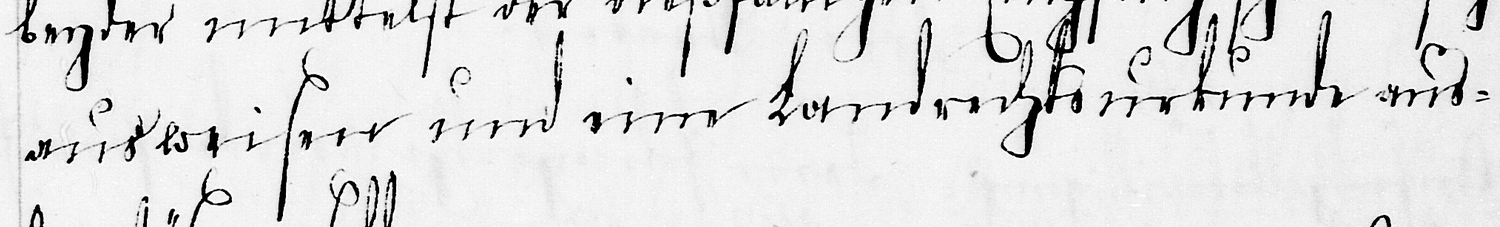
ausweisen und eine Landrechtsurkunde aus¬
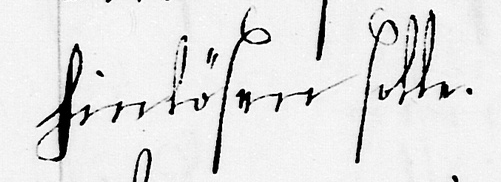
hinlösen soll¬
